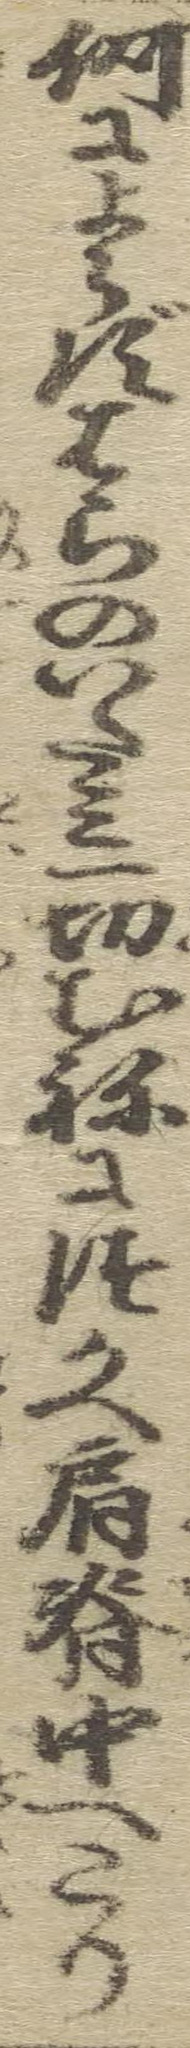何によらずはらのいたみ一切むねにつかへ肩脊中へこり
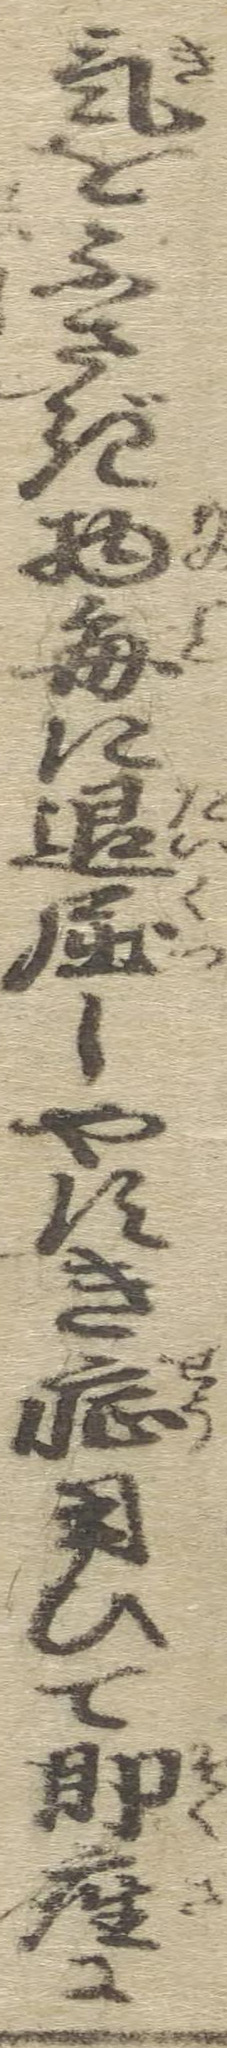気をふさぎ物毎に退屈しやすき症用ひて即座に
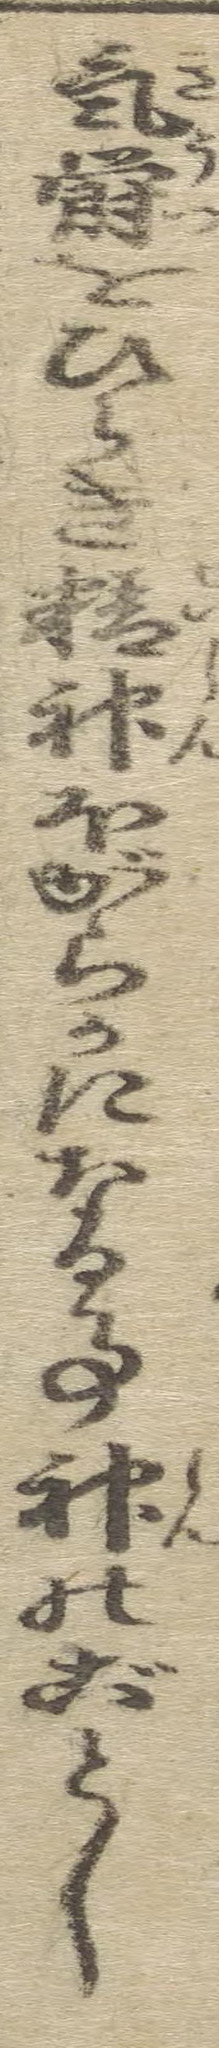気鬱をひらき精神ほがらかになる事神のごとし
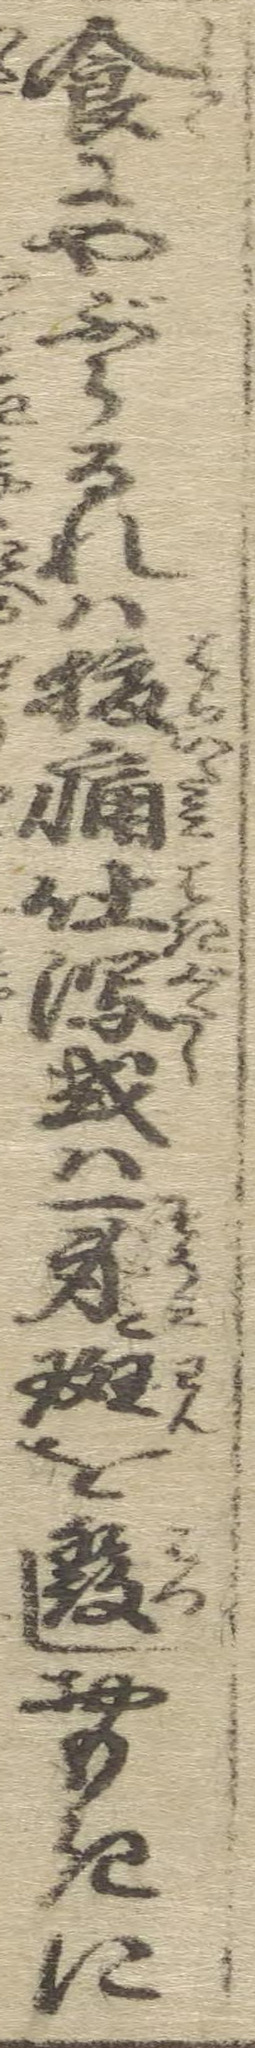食にやぶらるれは腹痛吐瀉或は一身に斑を発しおもきに
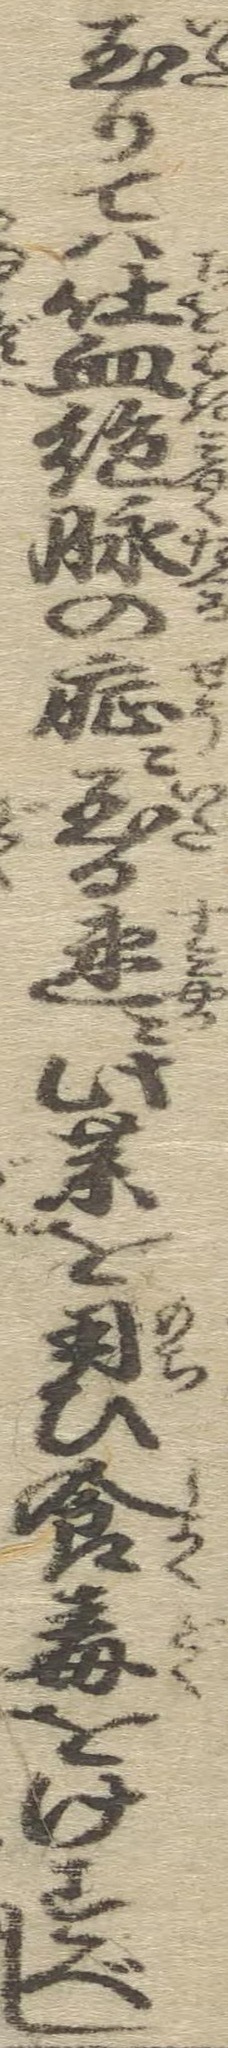至りては吐血絶脈の症に至る速に此薬を用ひ食毒をけすべし
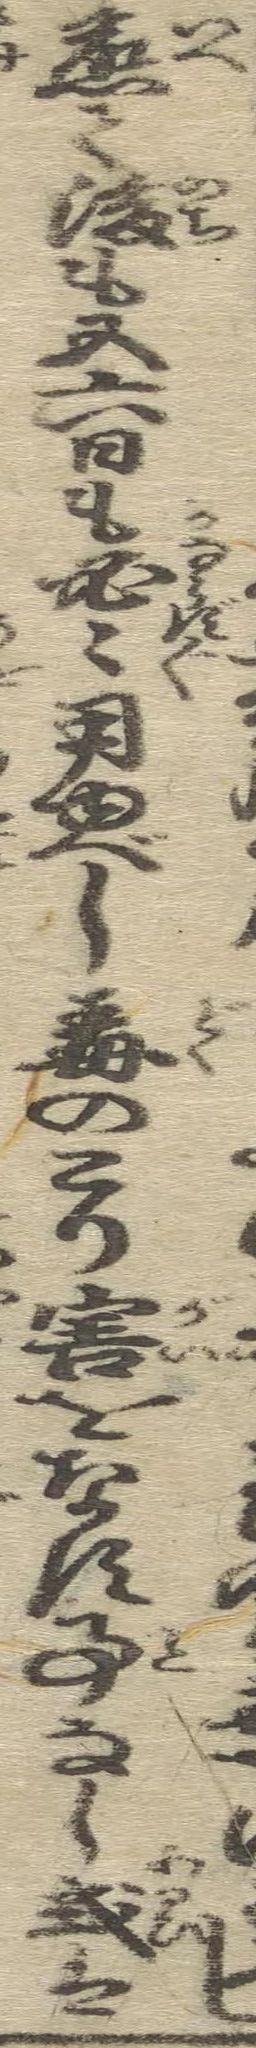愈て後も五六日も必々用ゆべし毒のこり害をなす事なし或は
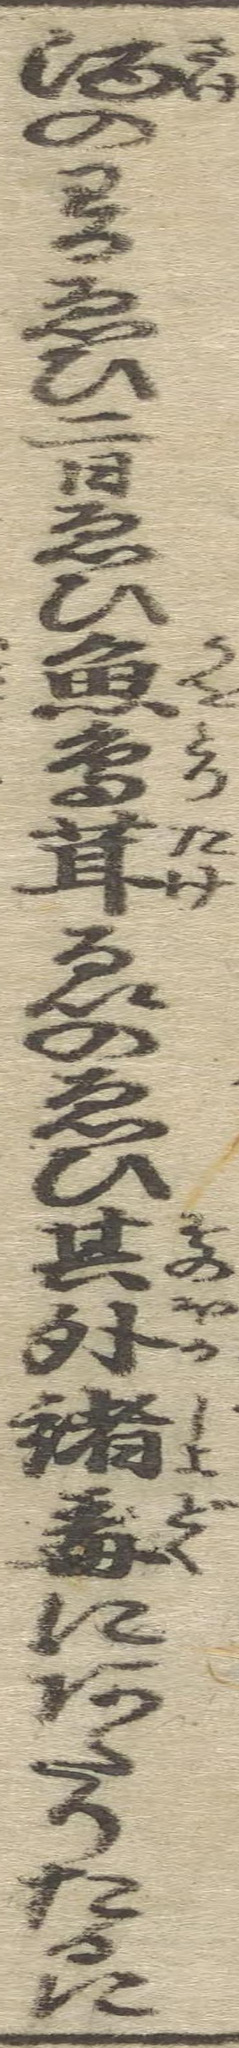酒のわるゑひ二日ゑひ魚鳥茸るいのゑひ其外諸毒にあたりたるに
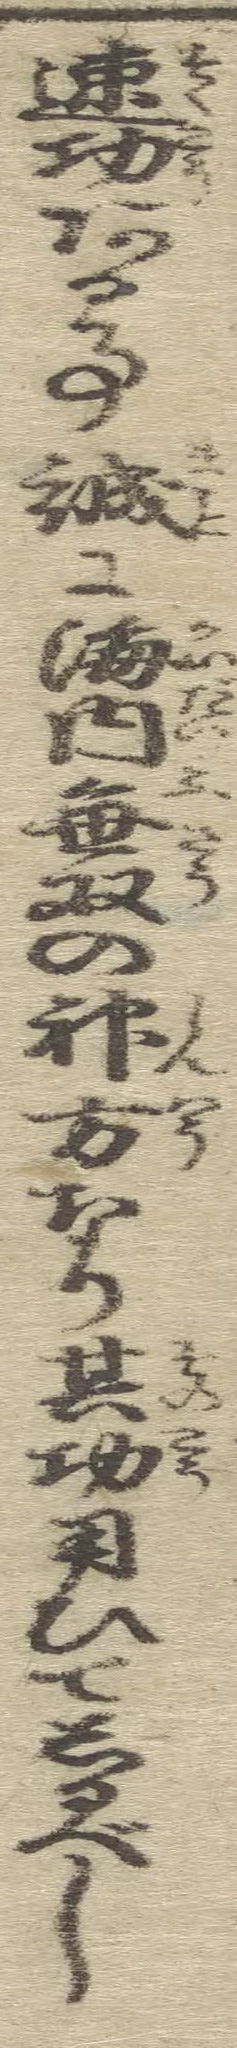速功ある事誠に海内無双の神方なり其功用ひてしるべし
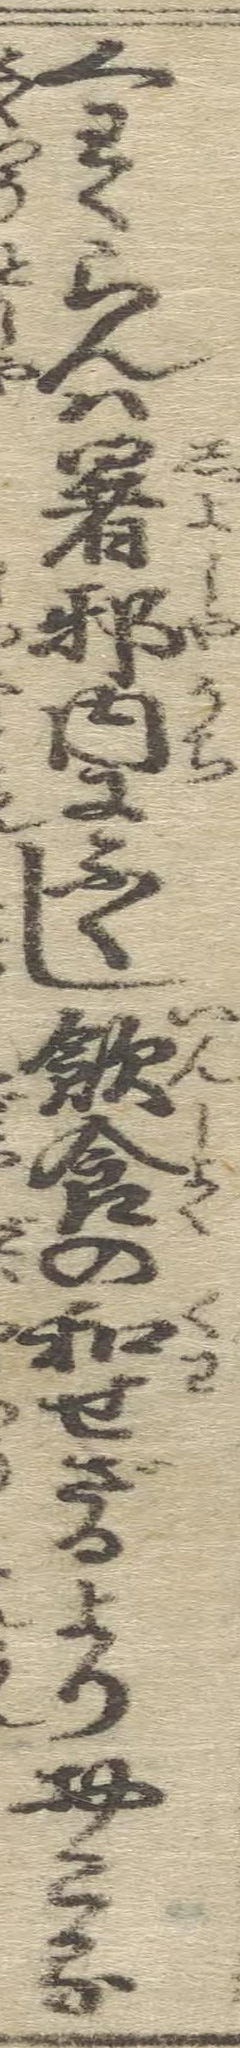くわくらんは暑邪内にふくし飲食の和せざるよりおこる
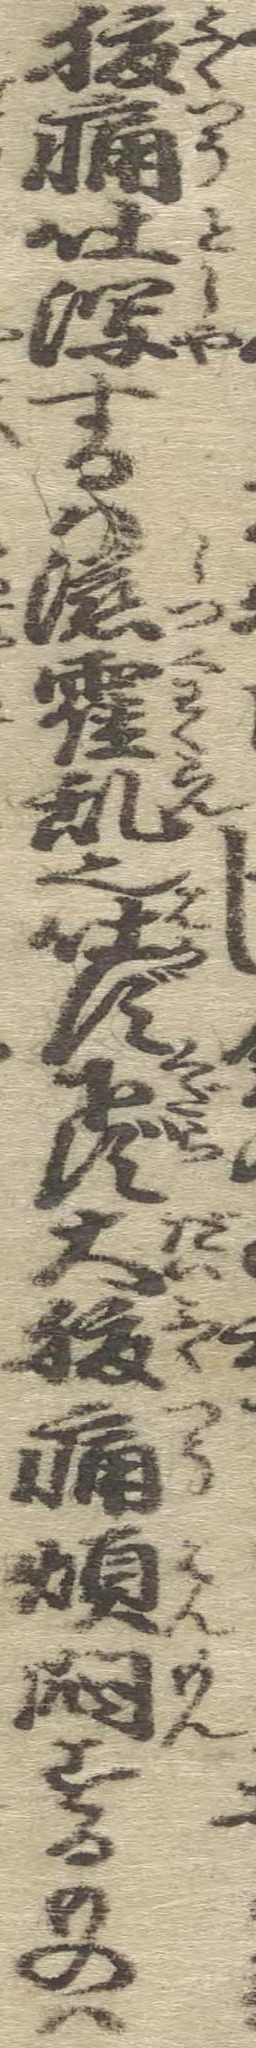腹痛吐瀉するは湿霍乱也吐ず下ず大腹痛煩悶」するものは
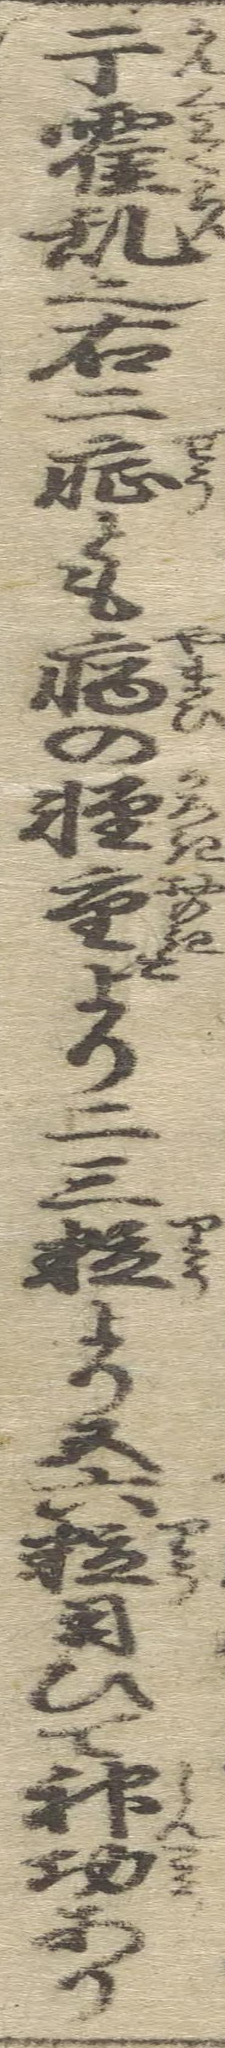干霍乱也右二症とも病の軽重によりニ三粒より五六粒用ひて神功あり
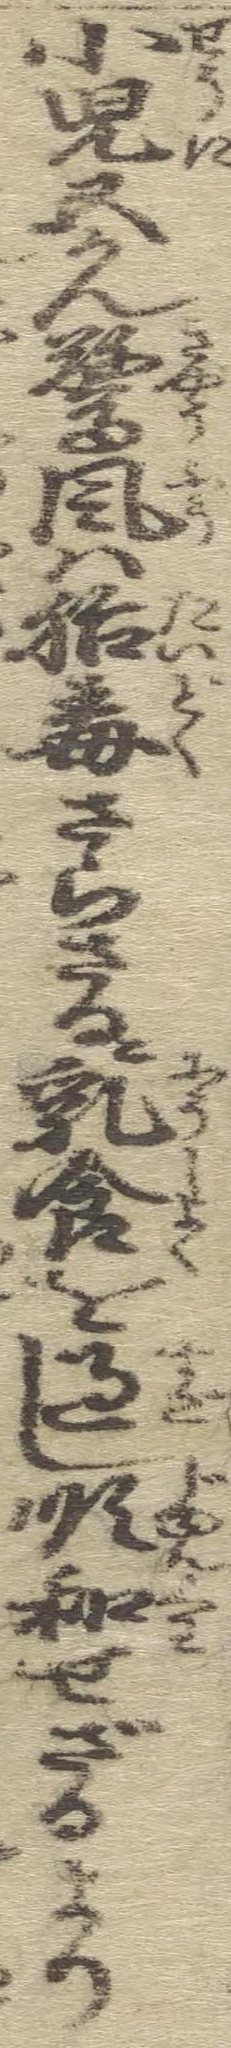小児五かん驚風は胎毒さらさるに乳食を過し順和せざるより
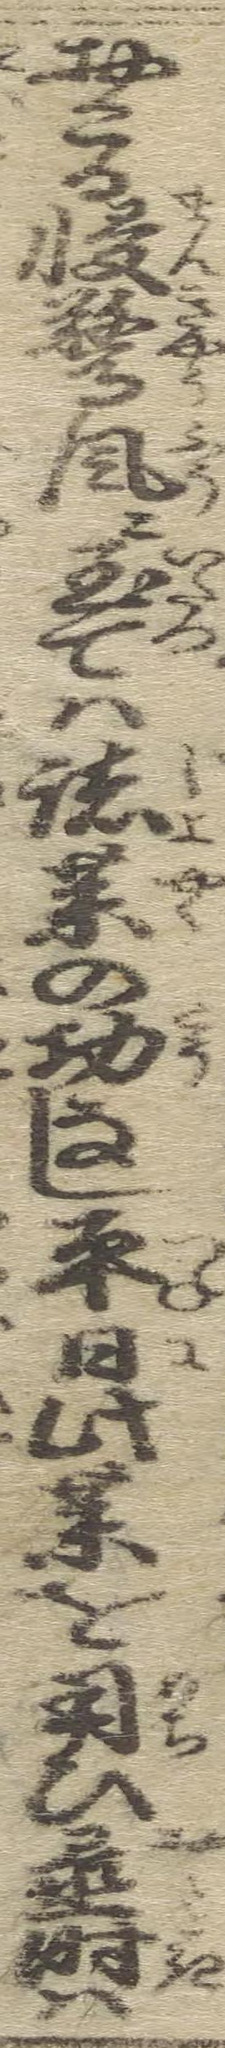おこる慢驚風に至ては諸薬の功なし平日此薬を用ひ置時は
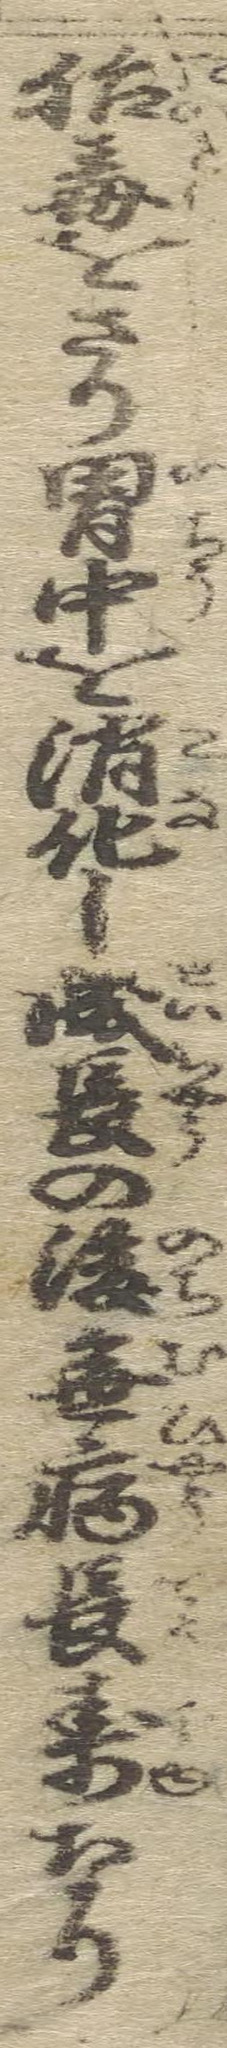胎毒をさり胃中を消化し成長の後無病長寿なり
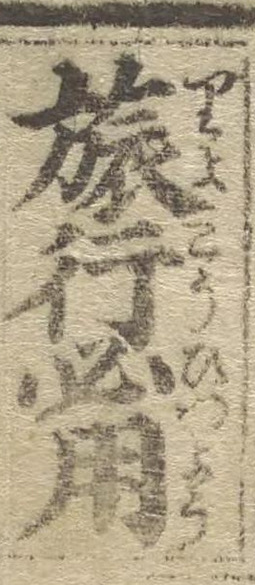旅行必要
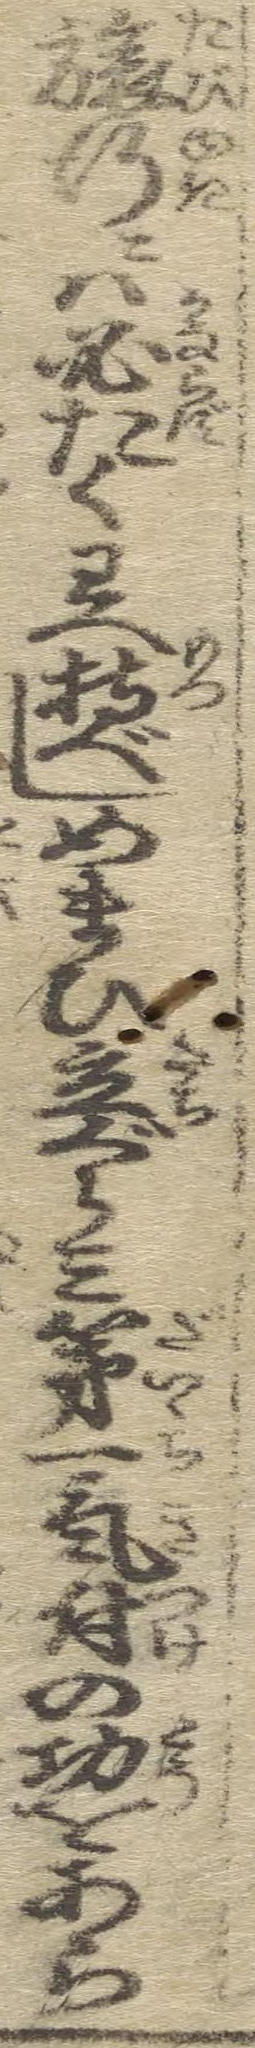旅行には必たくわへ持べしめまひ立ぐらみ第一気付の功をあら
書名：浪華薬種問屋能書張交帖. 二
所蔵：国立国会図書館 National Diet Library, JAPAN
